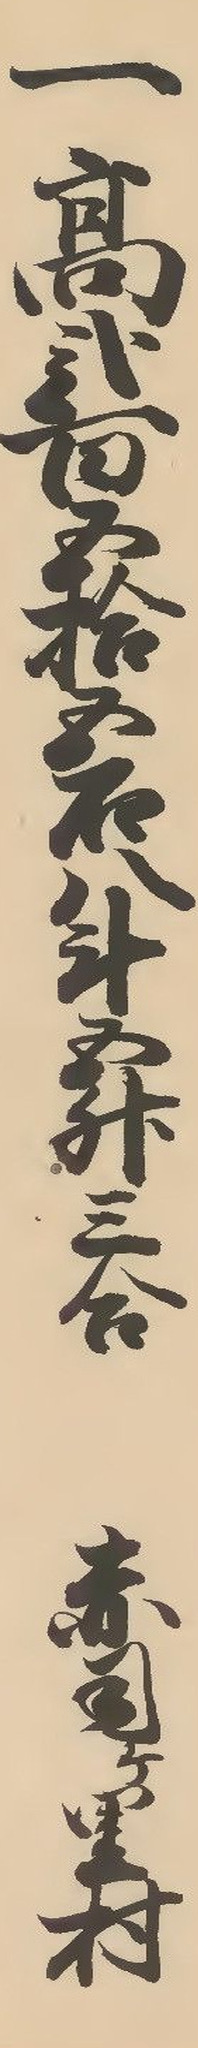一髙弐百五拾五石八斗五升三赤司ケ里村
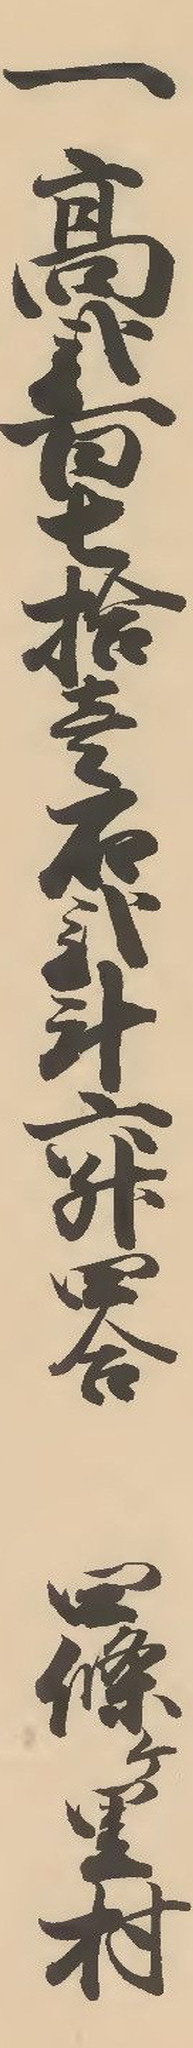一髙弐百七拾壱石弐斗六升四合四條ケ里村
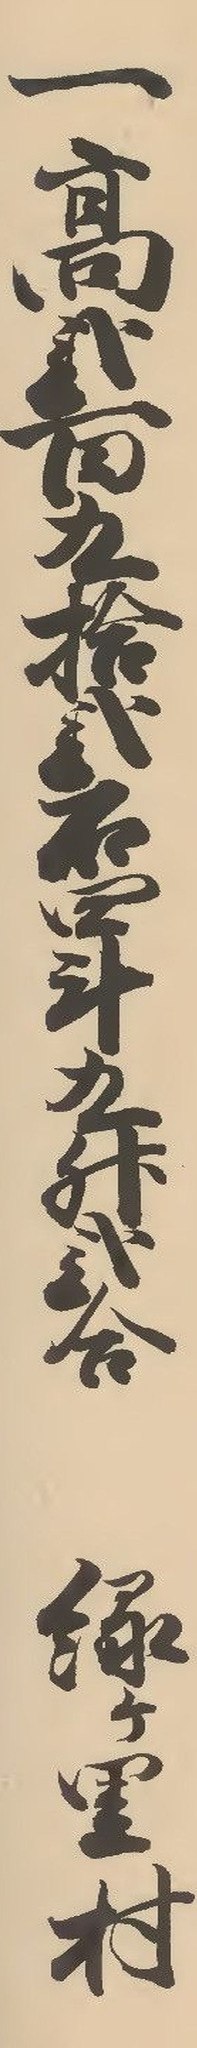一髙弐百九拾弐石四斗九升弐合ケ里村
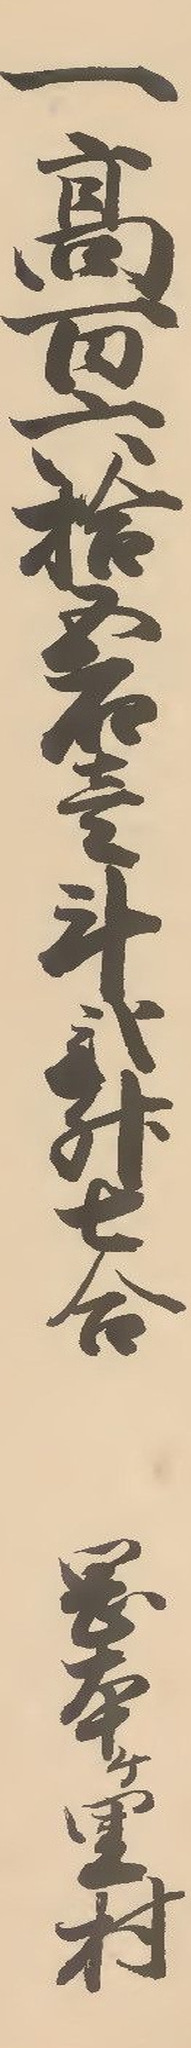一髙百六拾五石壱斗弐升七合岡本ケ里村
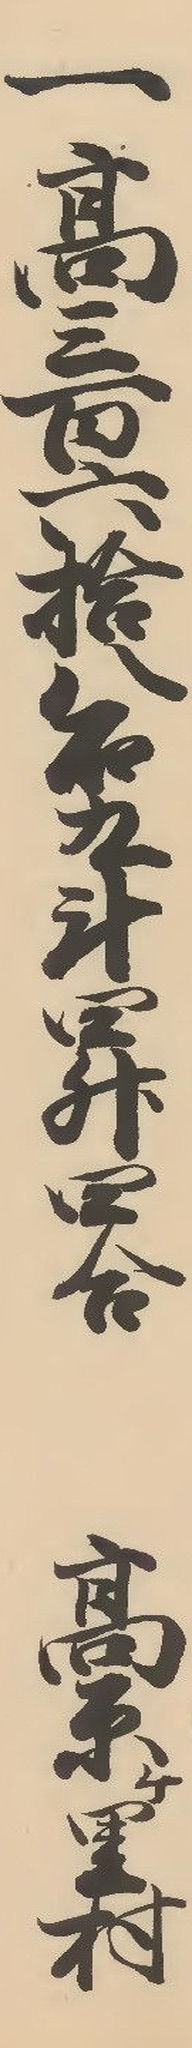一髙三百六拾八石九斗四升四合髙原ケ里村
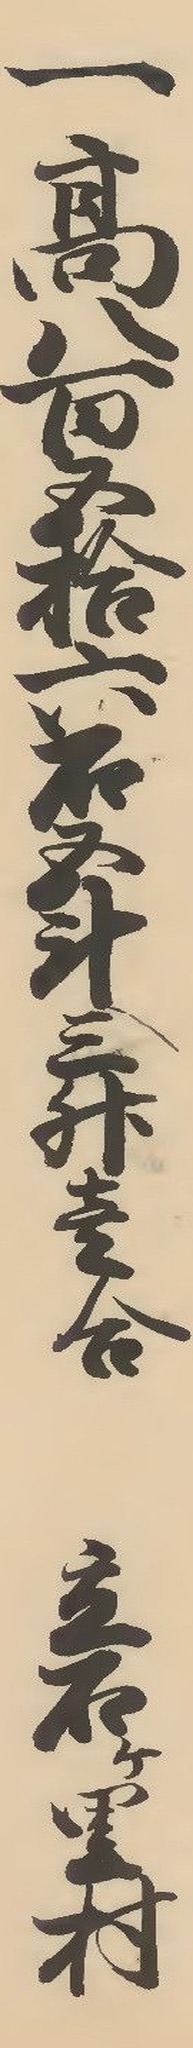一髙八百五拾六石五斗三升壱合立石ケ里村
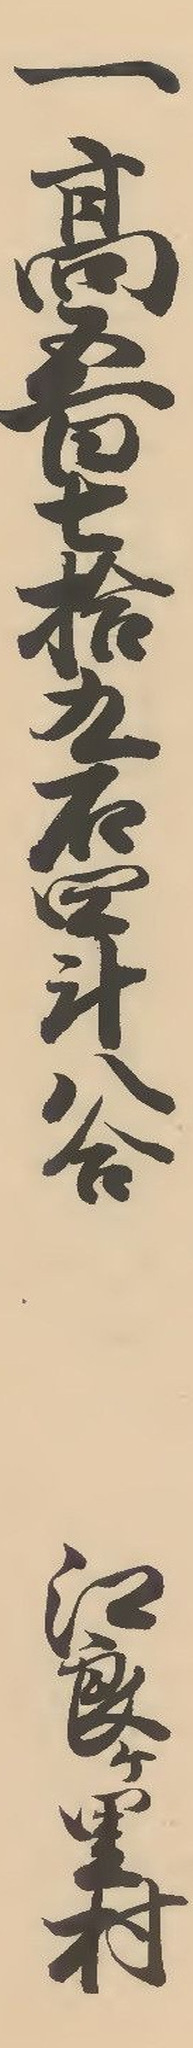一髙五百七拾九石四斗八合江良ケ里村

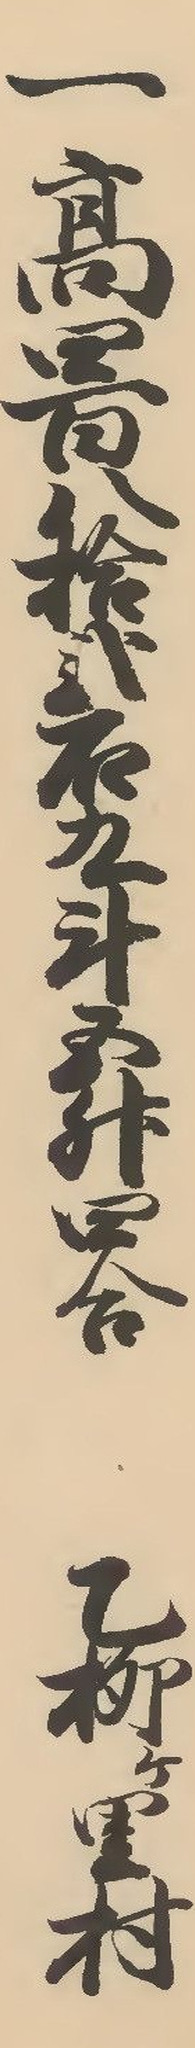一髙四百八拾弐石九斗五升四合乙柳ケ里村
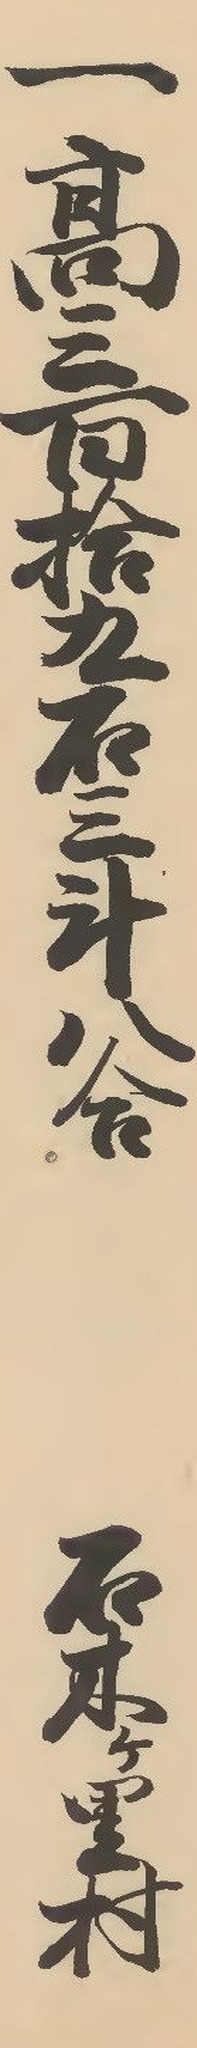一髙三百拾九石三斗八合石木ケ里村
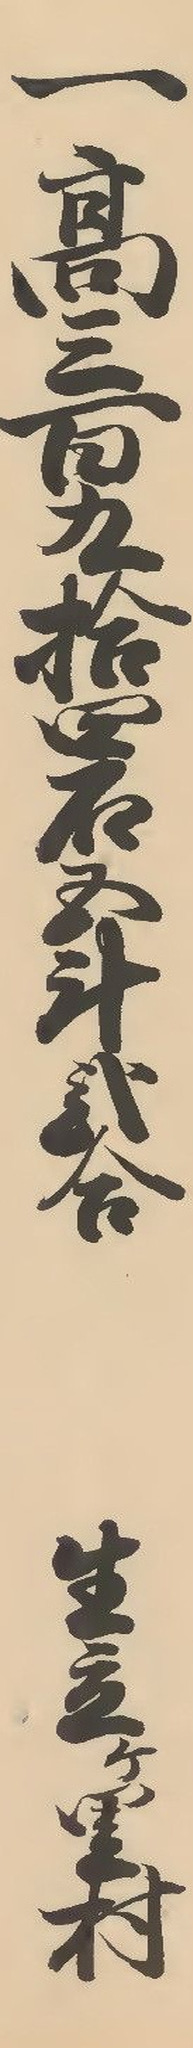一髙三百九拾四石五斗弐合生立ケ里村
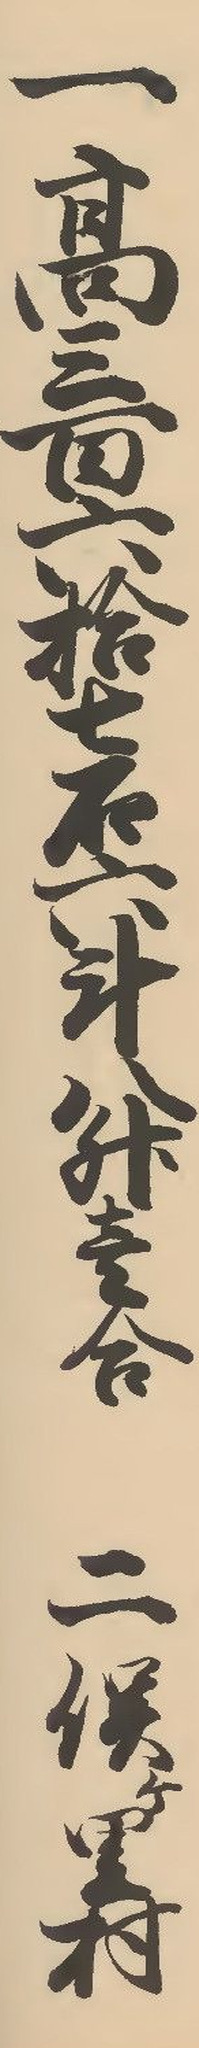一髙三百六拾七石六斗八升壱合二俣ケ里村
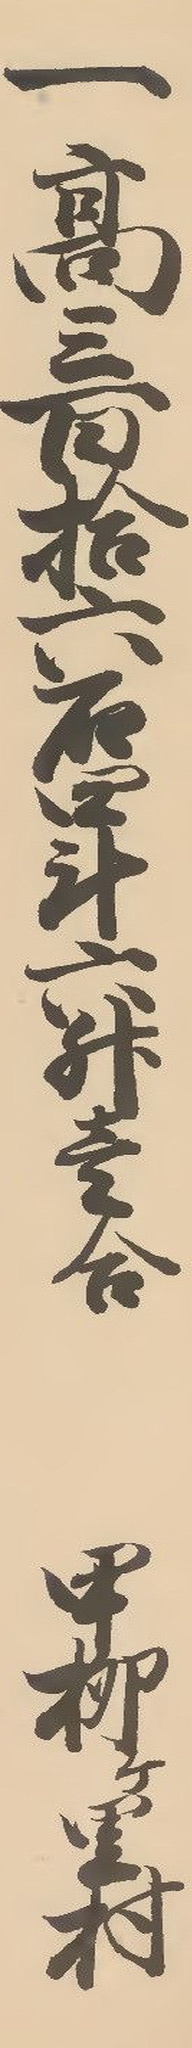一髙三百拾六石四斗六升壱合甲柳ケ里村
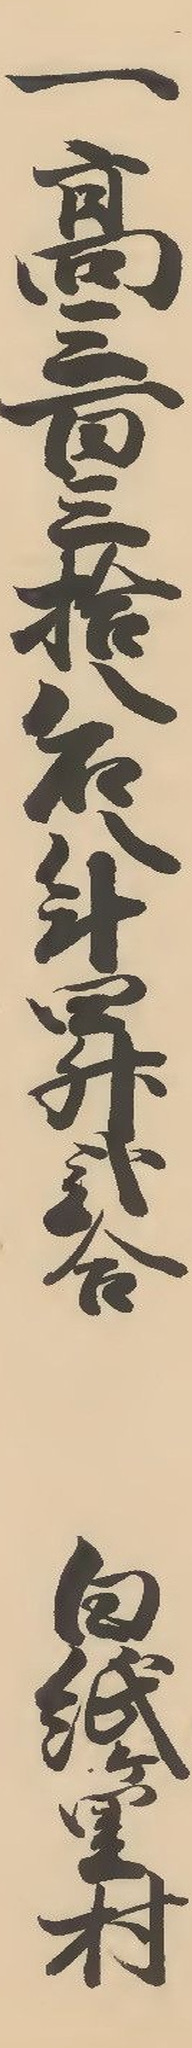一髙三百三拾八石八斗四升弐合白紙ケ里村
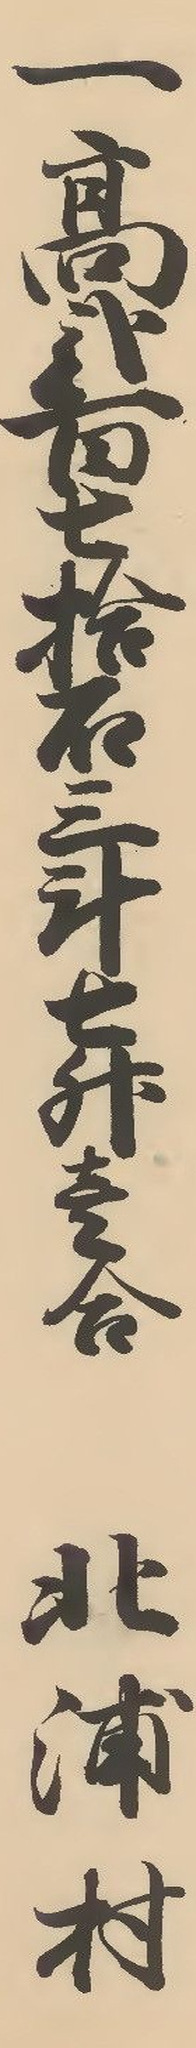一髙弐百七拾石三斗七升壱合北浦村
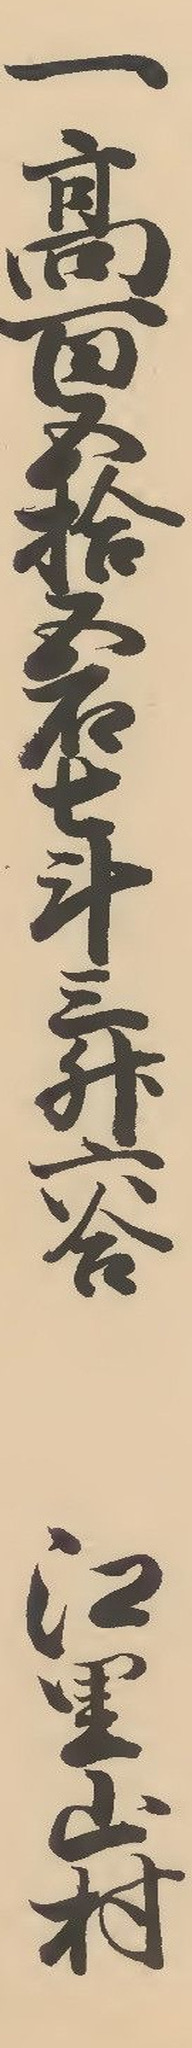一髙百五拾五石七斗三升六合江里山村

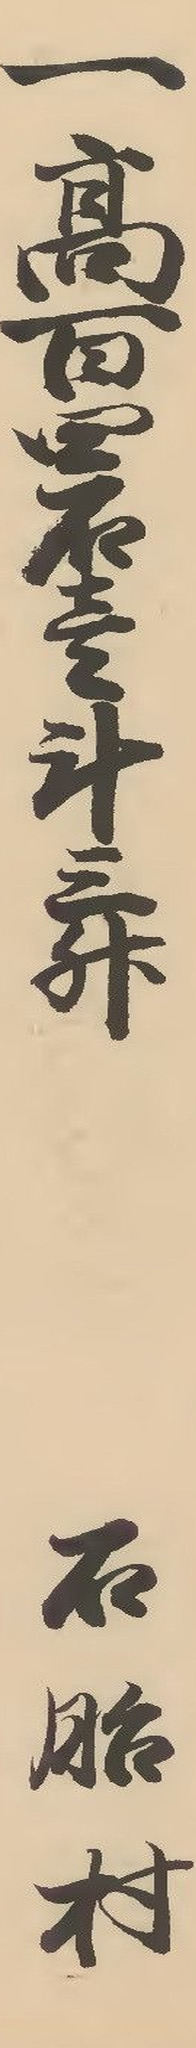一髙百四石壱斗三升石村
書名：肥前国郷帳
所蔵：国立公文書館 National Archives of Japan
